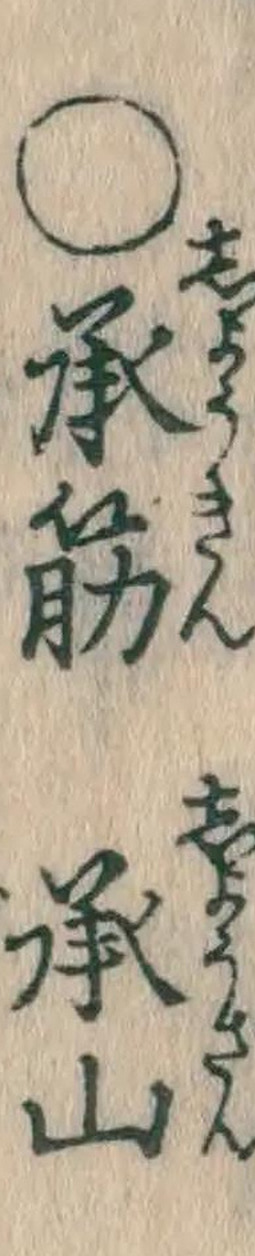○承筋承山
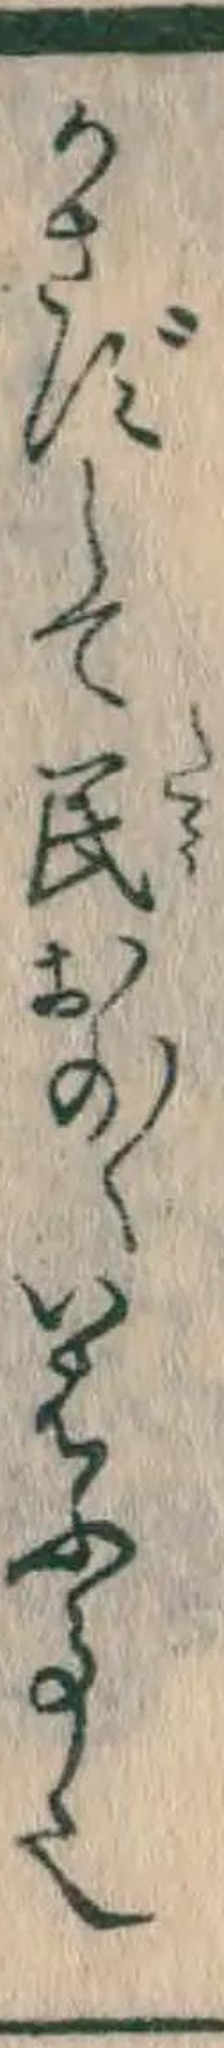かさずして民おの〳〵いはふ事也
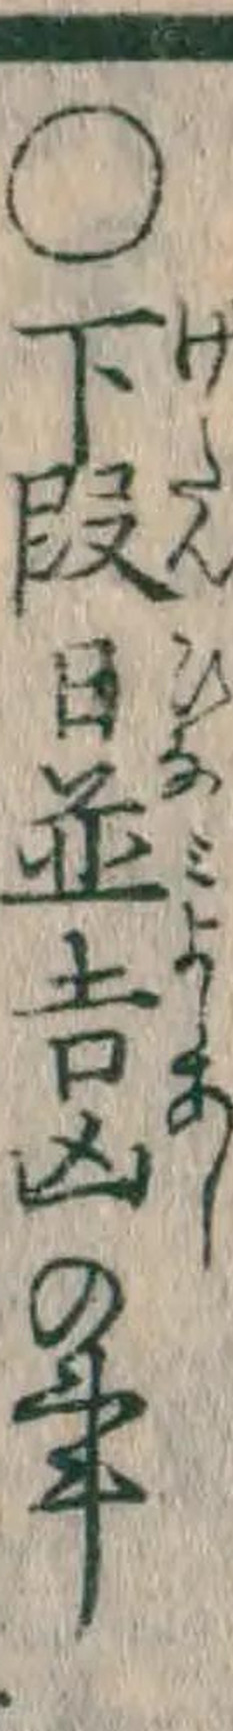○下段日並吉凶の事
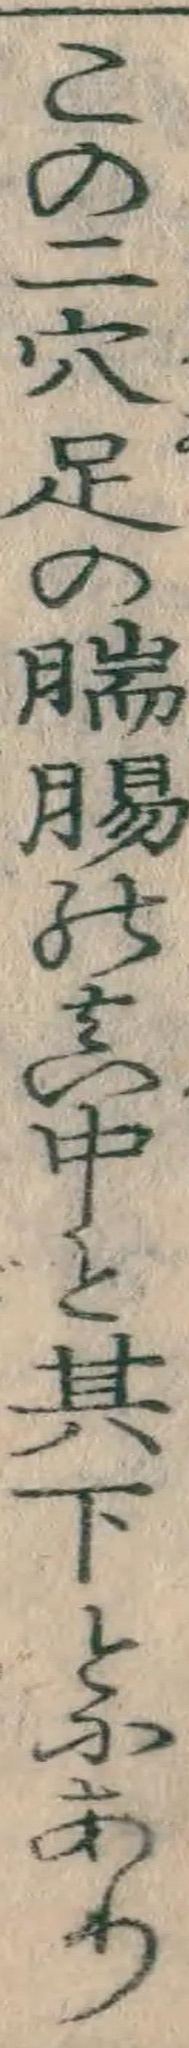この二穴足の腨腸の真中と其下とにあり
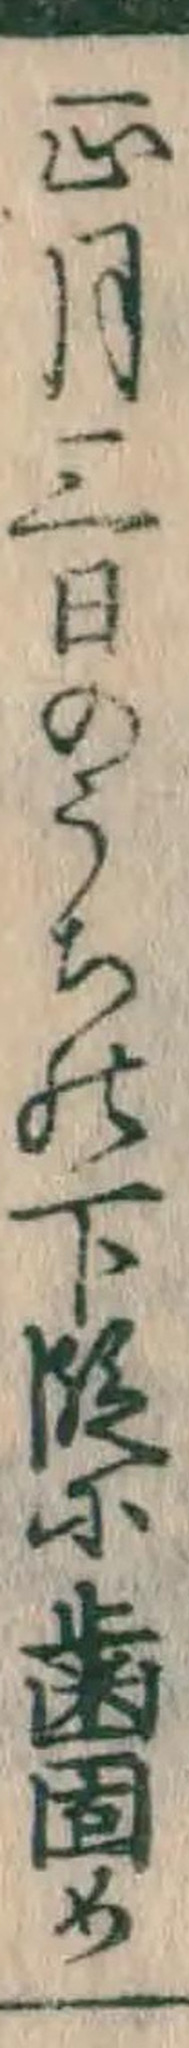正月三日のうちの下段に歯固め
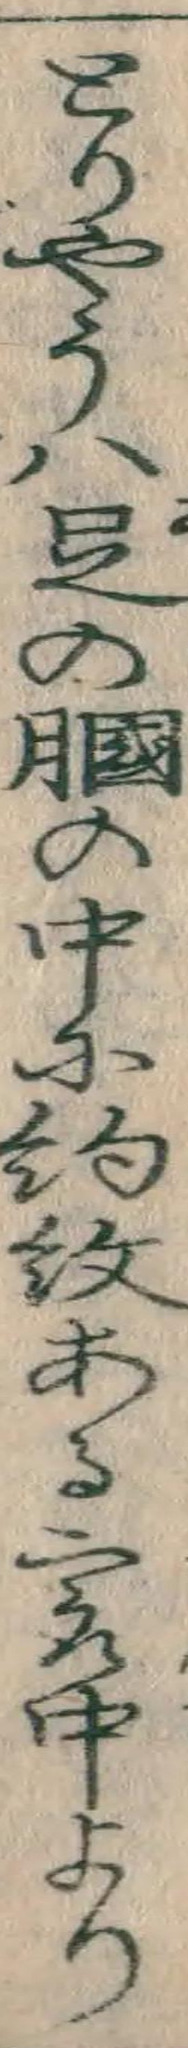とりやうは足の膕の中に約文ある最中より
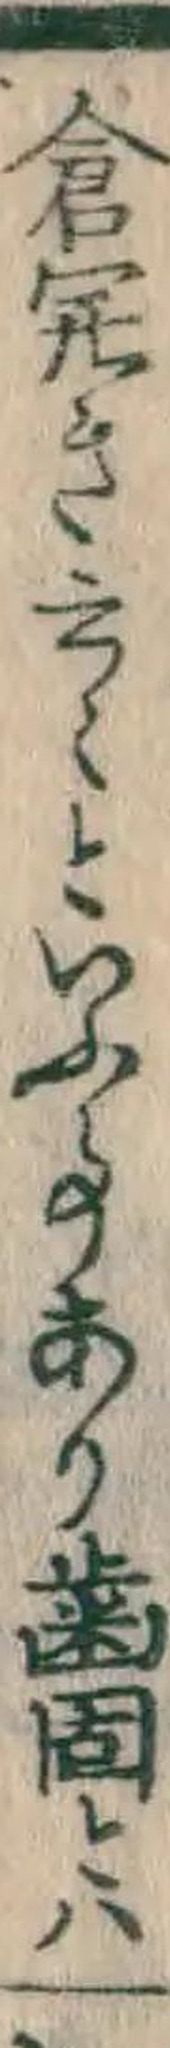倉開き云々といふ事あり歯固とは
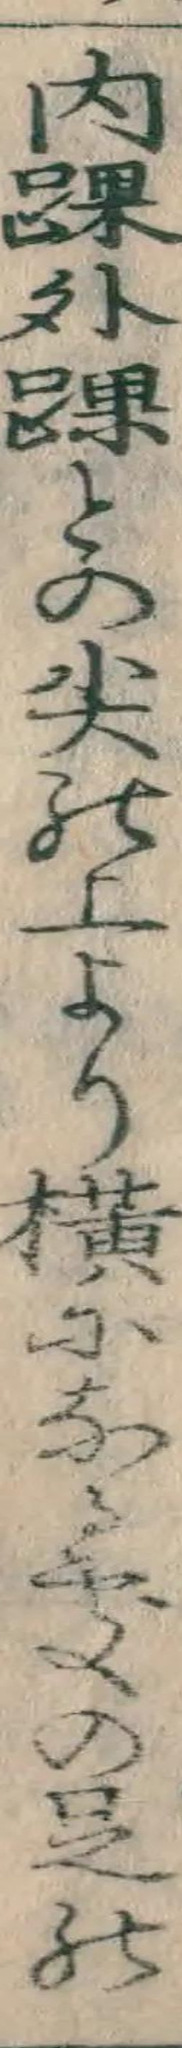内踝外踝との尖の上より横になる処の足の
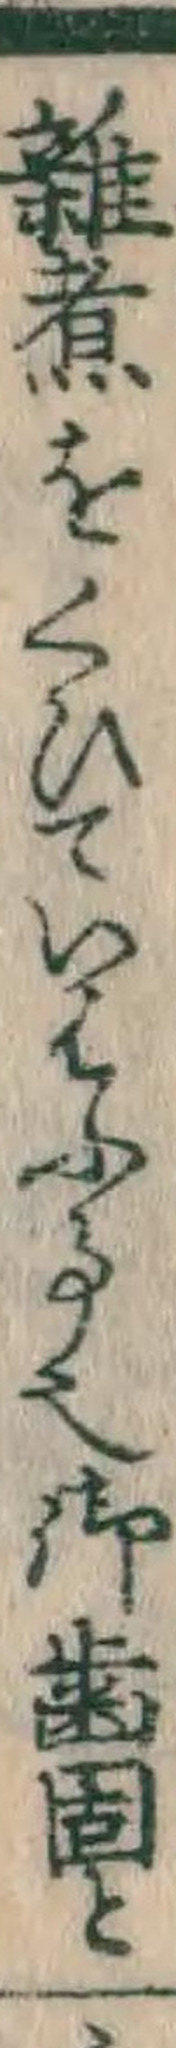雑煮をくひていはふ事也御歯固と
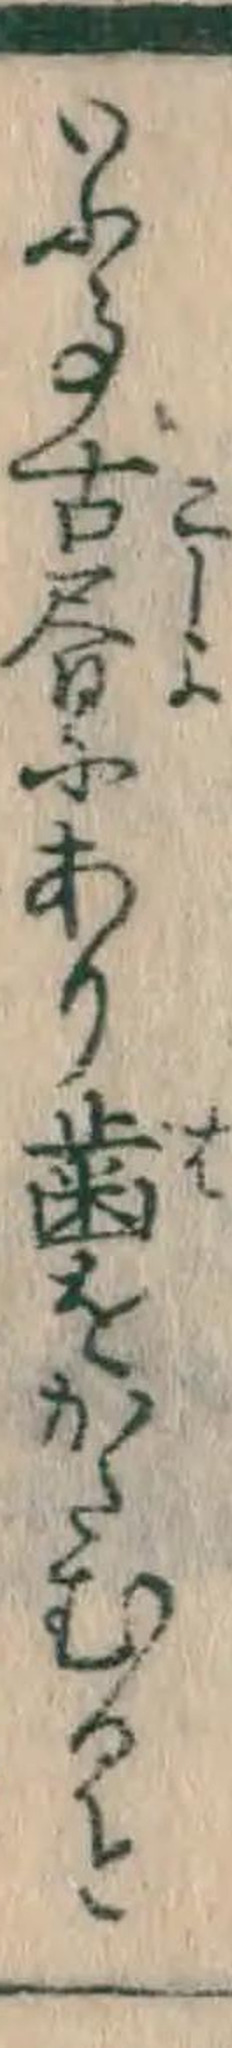いふ事古書にあり歯をかたむると
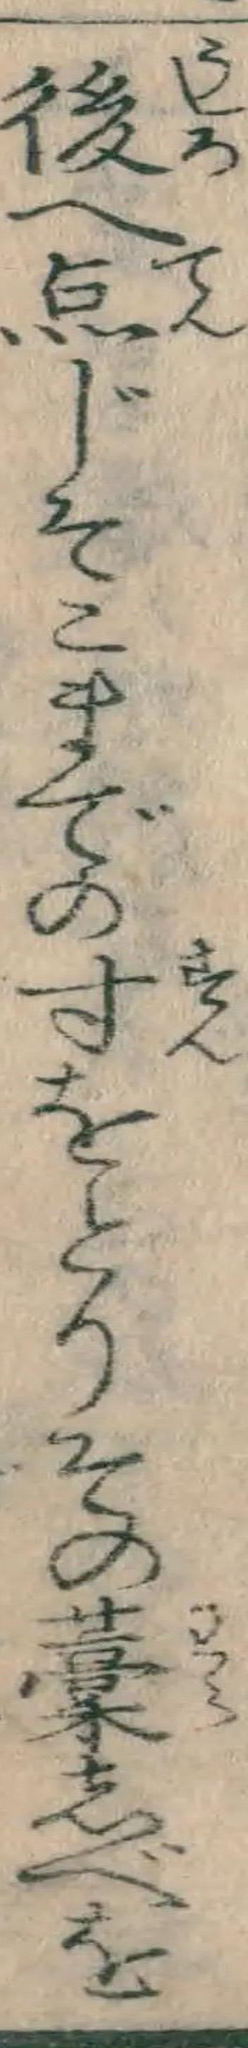後へ点じそこまでの寸をとりその藁しべを
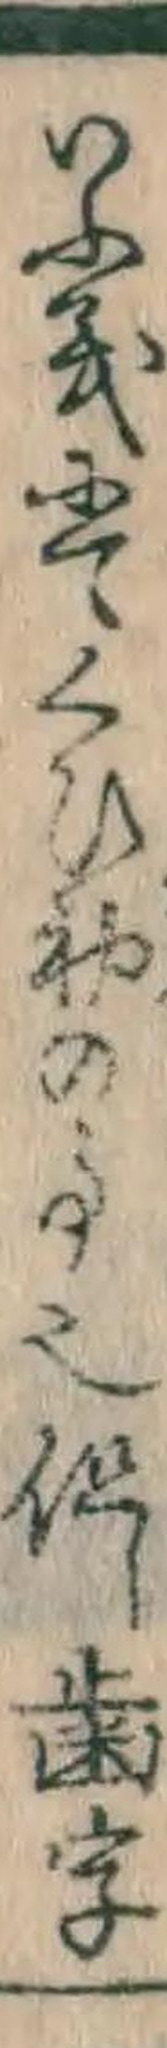いふ義にてくひ初の事也但し歯字
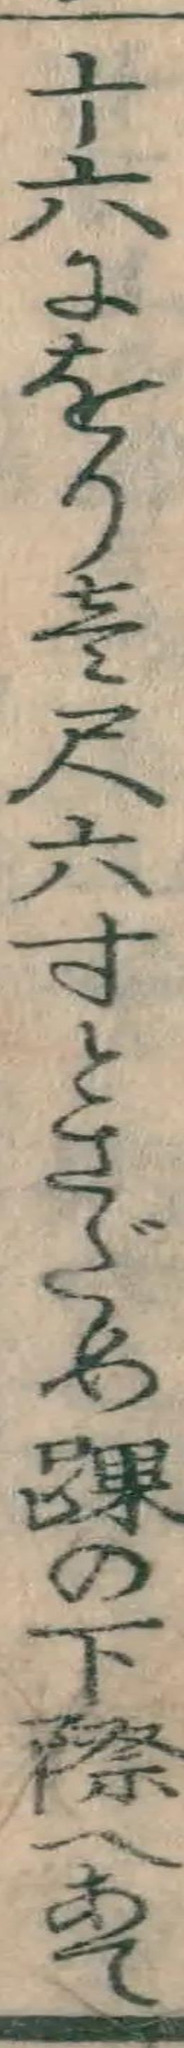十六にをり壱尺六寸とさだめ踝の下際へあて

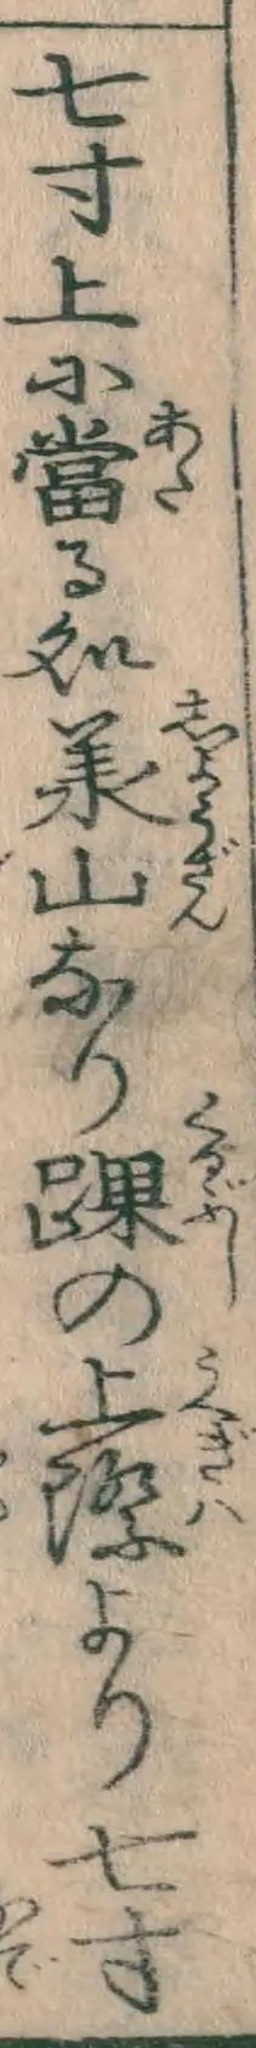七寸上に当る処承山なり踝の上際より七寸
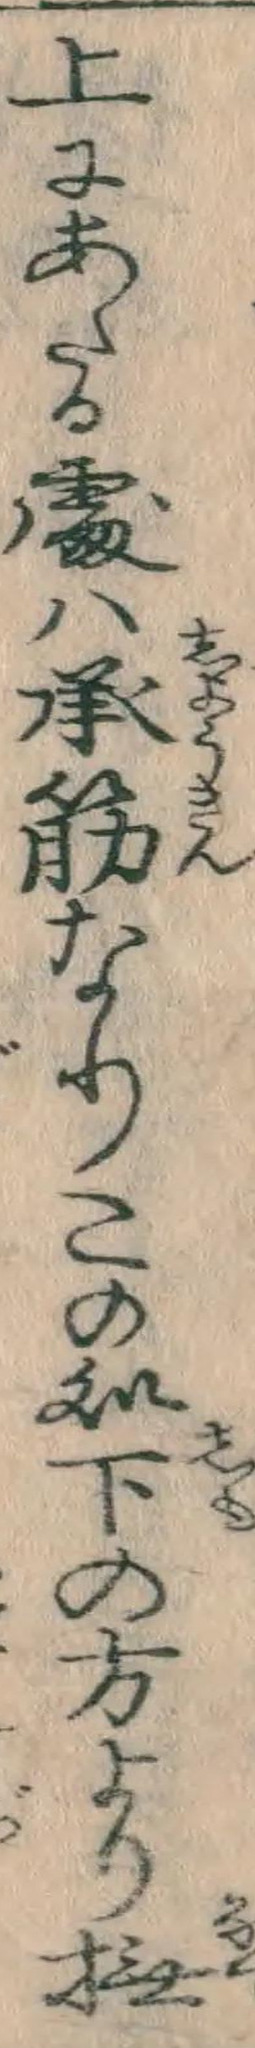上にあたる処は承筋なりこの処下の方より撫
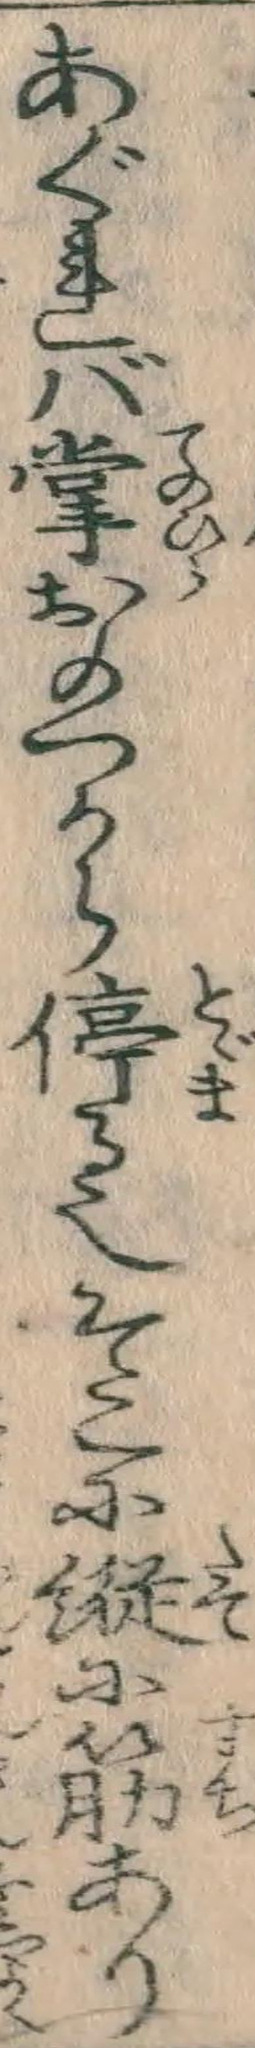あぐれば掌おのつから停る也そこに縦に筋あり
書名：広益秘事大全 3巻. [4]
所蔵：国立国会図書館 National Diet Library, JAPAN
